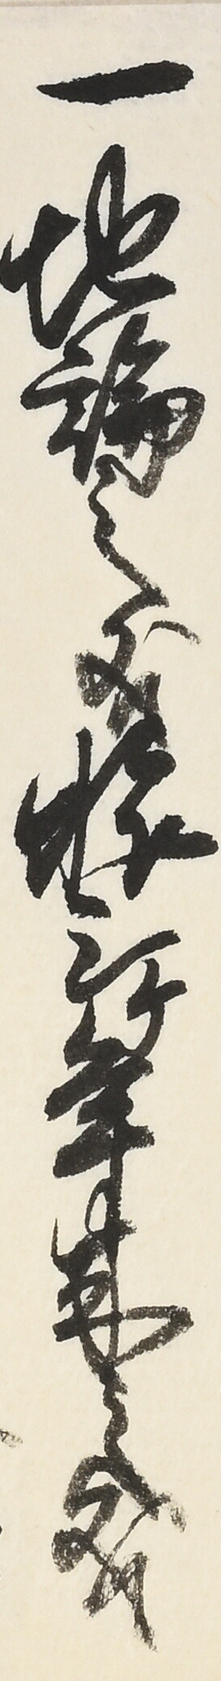一地論之義拾三ヶ年来之義
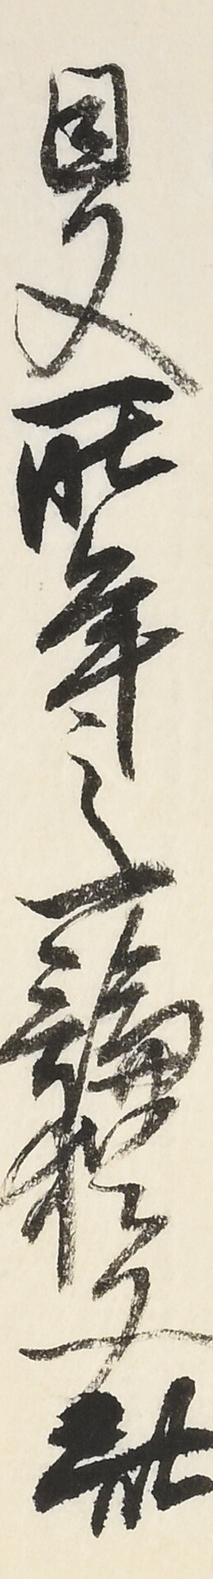且又一昨年之一論猶又此
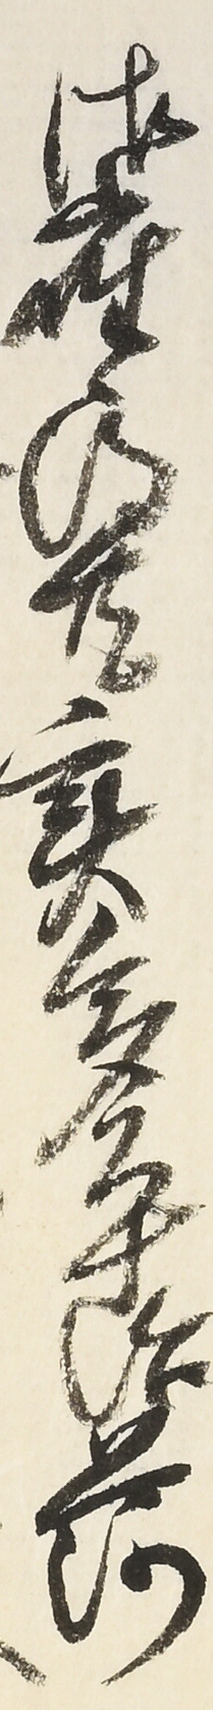御座候得共実多平治荷
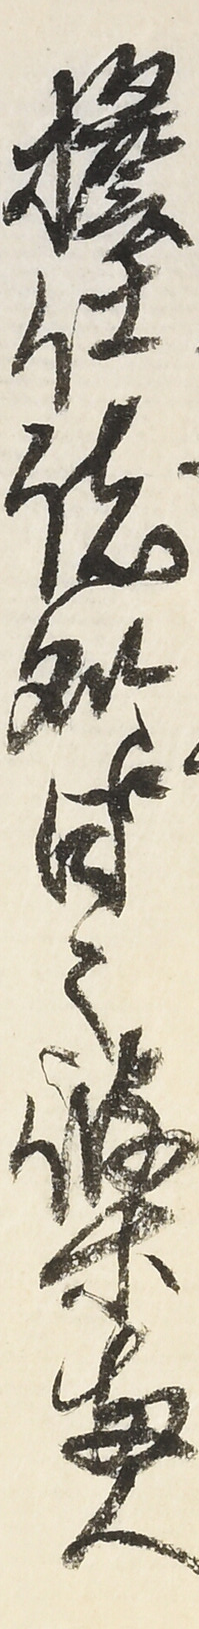檐仕諸処江日々彼等両人
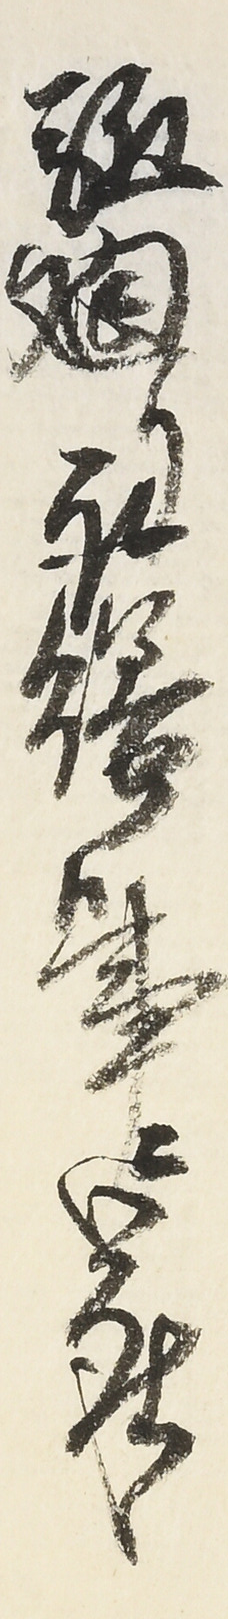駈廻り取繕候事ニ御座候
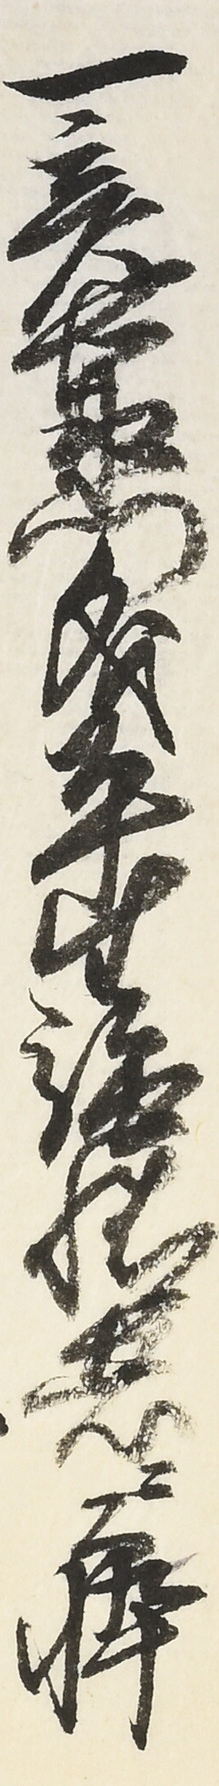一彦右衛門義平生強情者ニ而倅
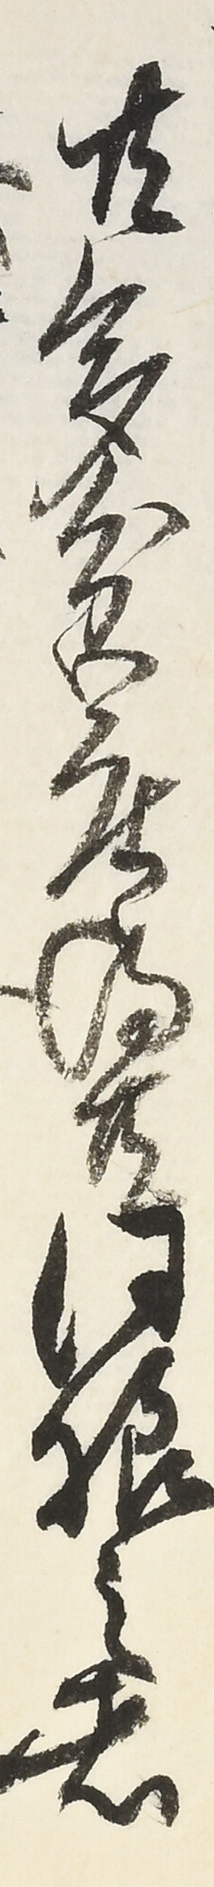共多分御座候得共同様之者
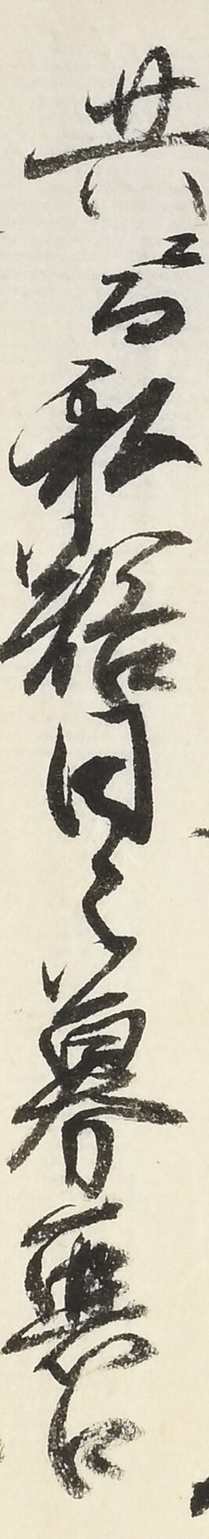共ニ而私日々募悪口
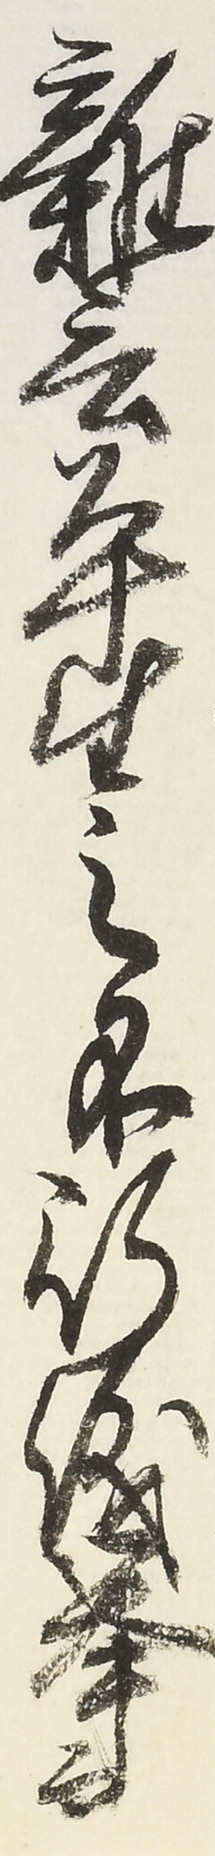雑言平生之不役儀奉而
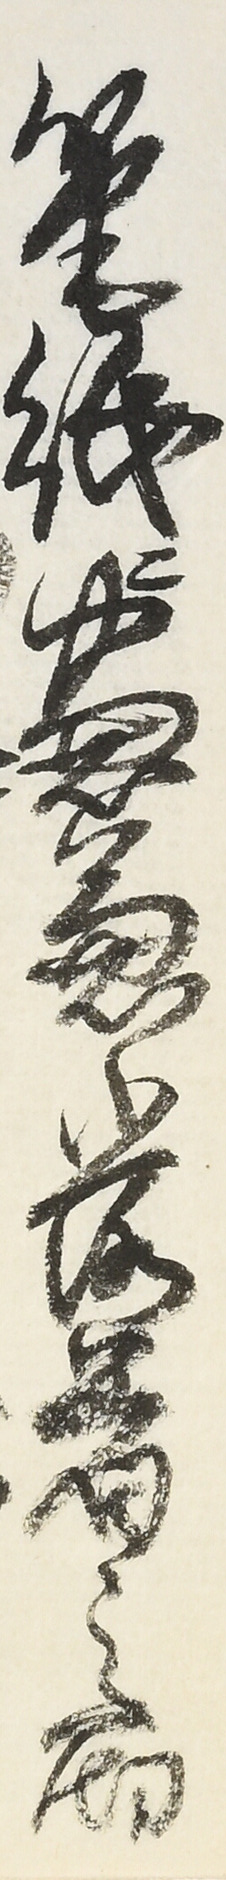筆紙ニ尽兼御落着之励
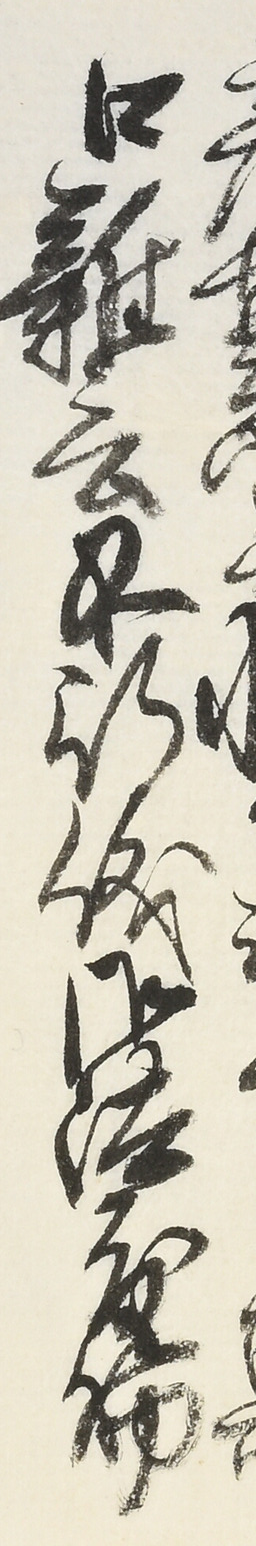口雑言不行儀御法度筋

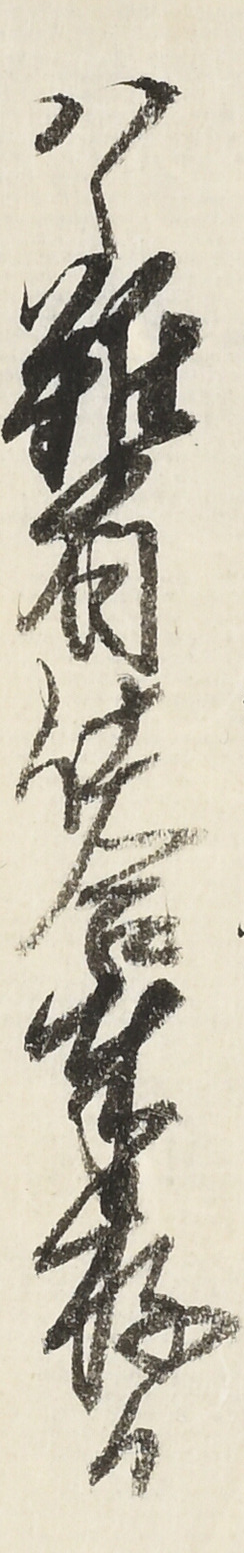ハゝ難有仕合奉存候
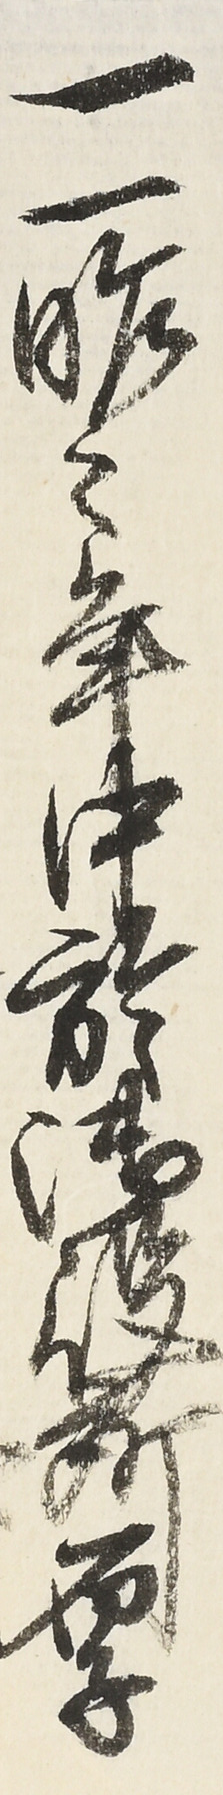一一昨々年中於御役所厚
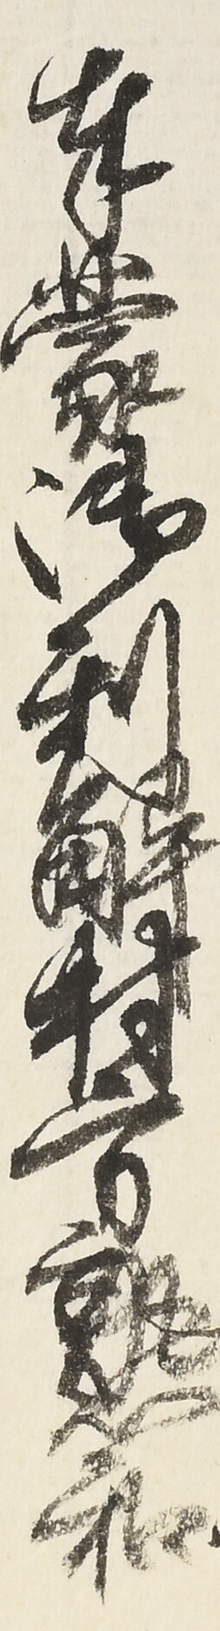奉蒙御利解村方熟和
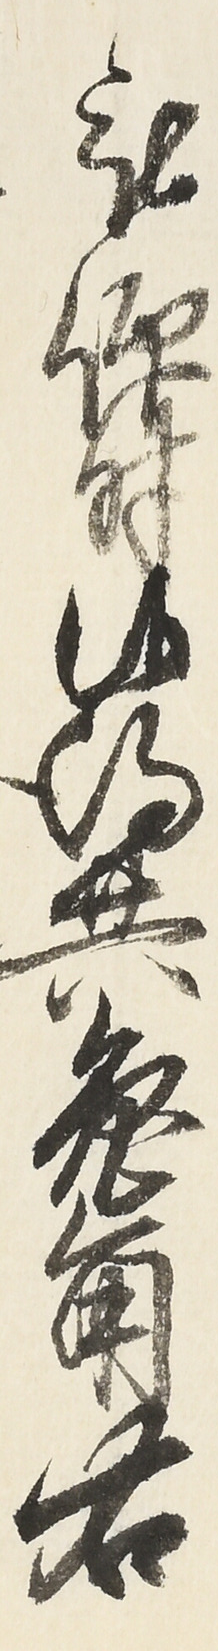被仰付候得共兎角右
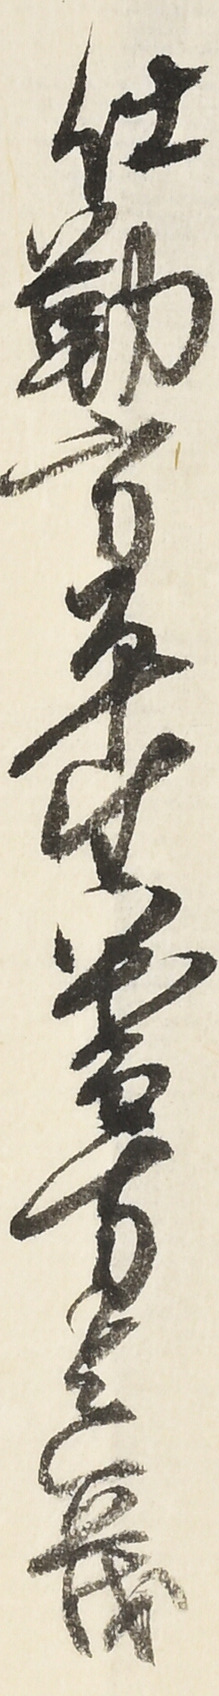仕勤方平生番方迄茂
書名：乍恐御内々子委奉申上度口上書
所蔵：伊那市立高遠町図書館・合同会社AMANE
